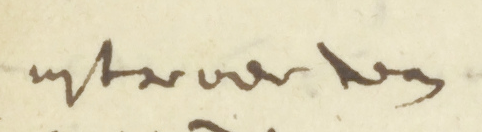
Uytvoer van
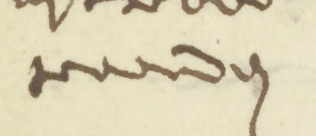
peerden
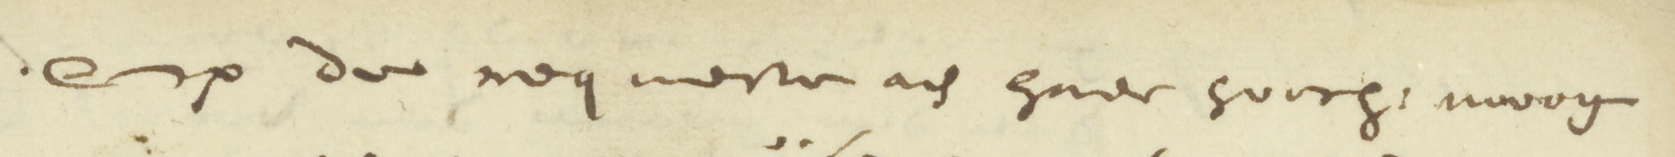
Op de requeste aen haer hooch moog
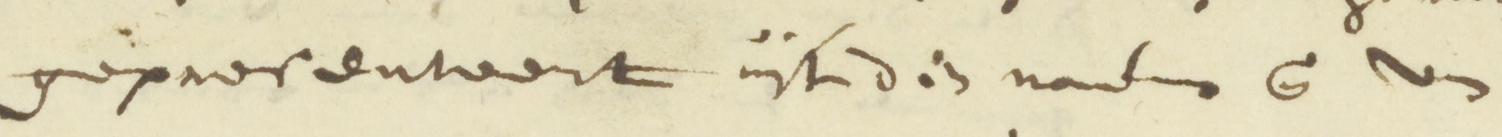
gepresenteert uijt den naem & van
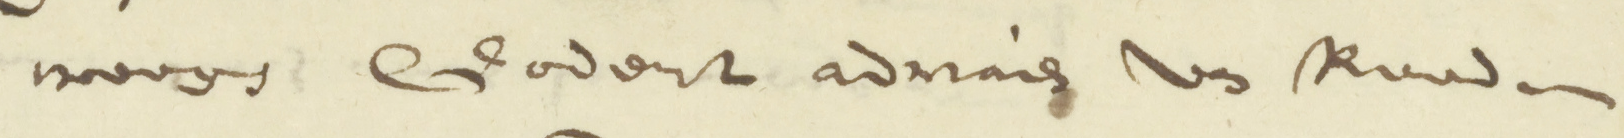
weegen Godert Adriaen van Reeden
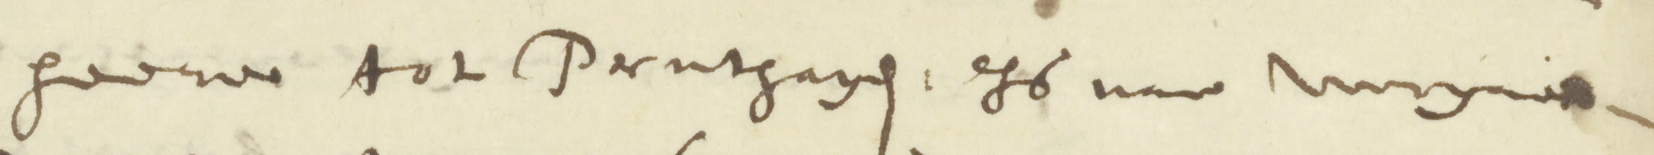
heere tot Printhagen. Is nae voorgaende
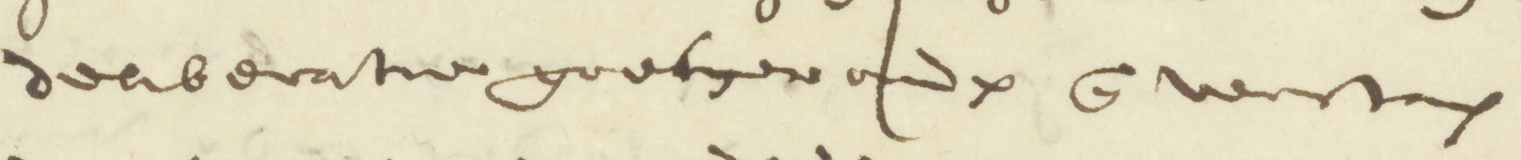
deliberatie goetgevonden & verstaen
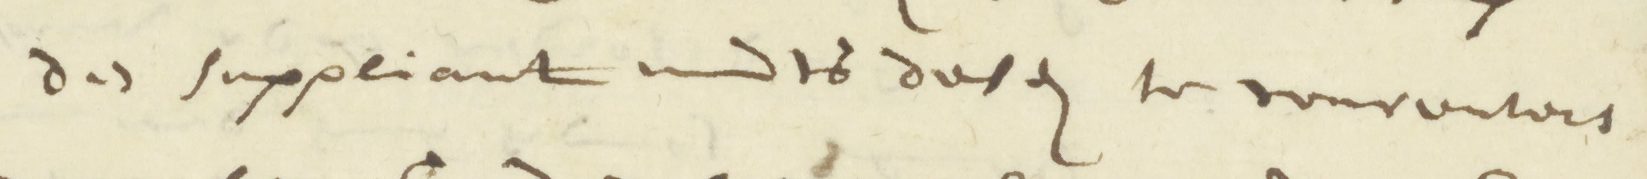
den suppliant midts desen te consenteren
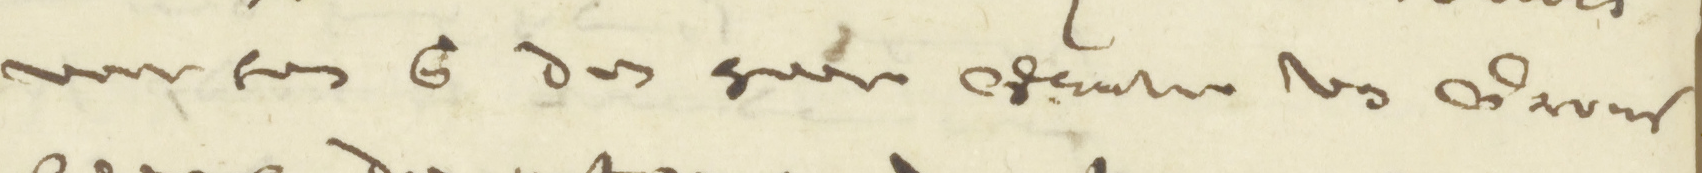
voor hem & den heer Grave van Grons
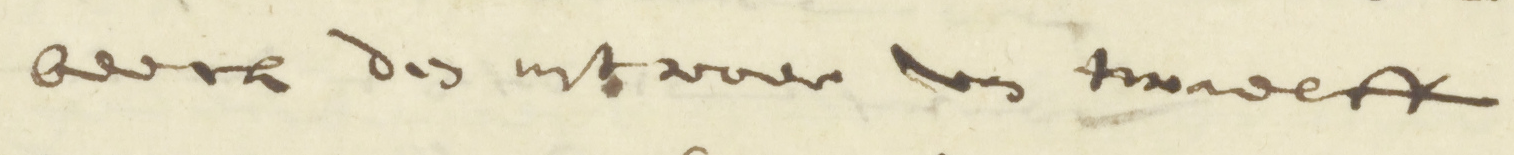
beeck den uytvoer van twaelff
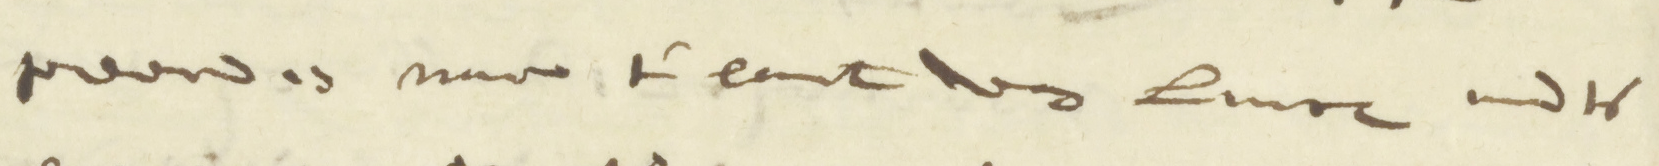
peerden naer t' lant van Luick midts
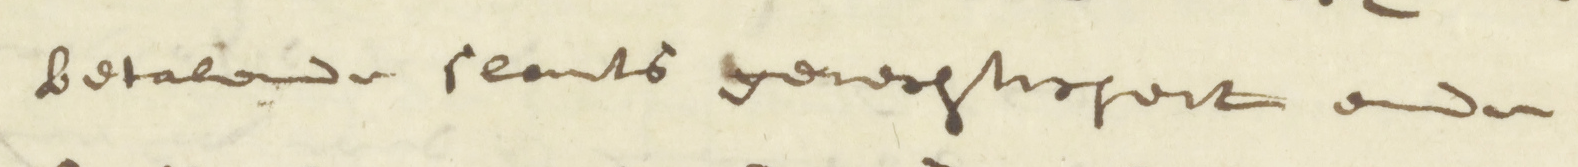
betalende slants gerechticheit ende
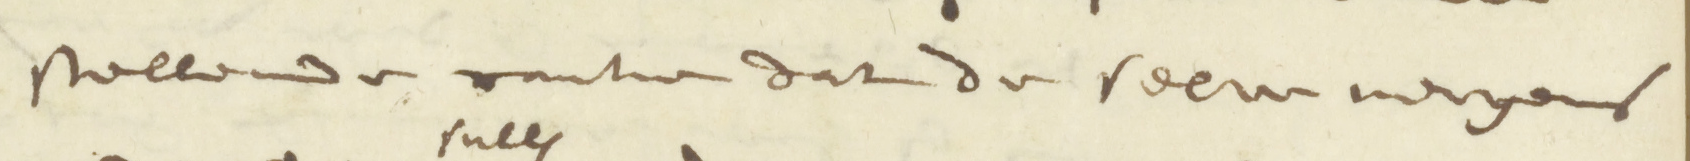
stellende cautie dat de selve nergens
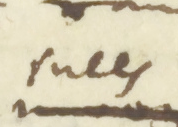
sullen
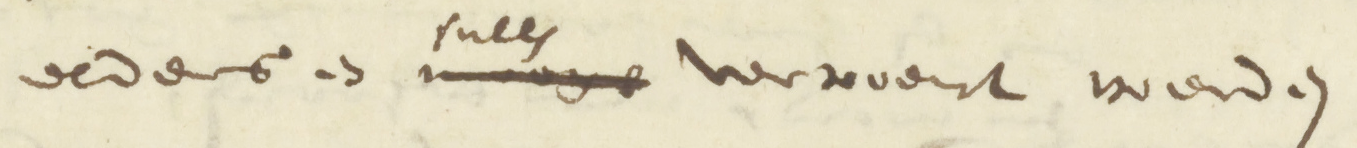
elders en mogen vervoert werden
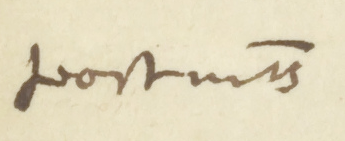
postmrs
